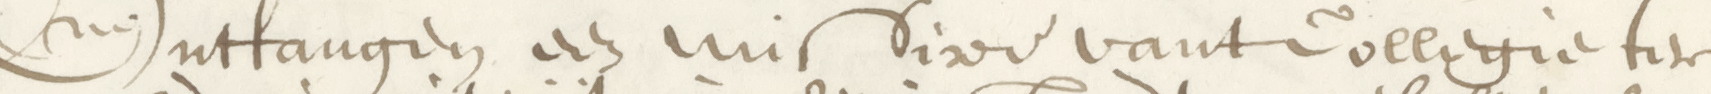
Ontfangen een Missive vant Collegie ter
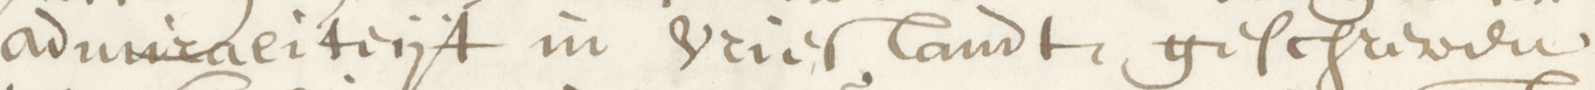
Admiraliteijt in Vrieslandt, geschreven
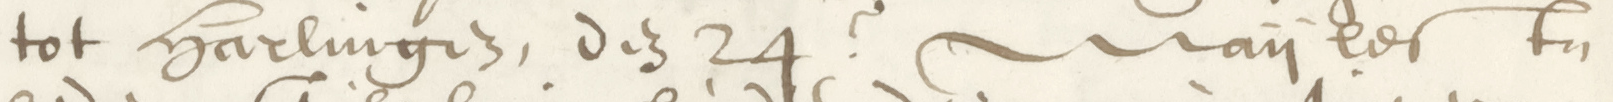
tot Harlingen, den 24e. Maij lest„
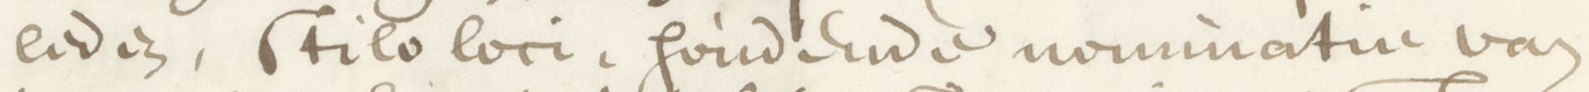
leden, stilo loci, houdende nominatie van
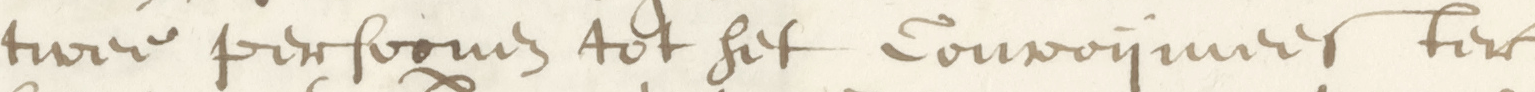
twee persoonen tot het Convoijmeester„
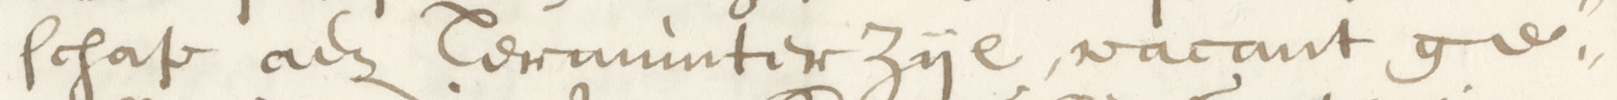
schap aen TermunterZijl, vacant ge,,
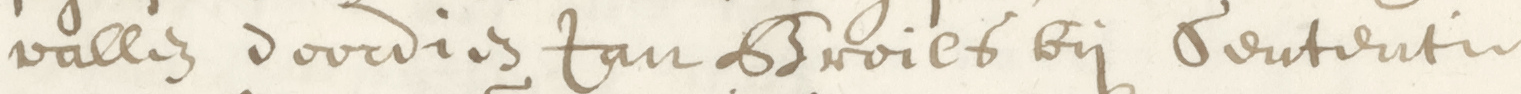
vallen doordien Jan Broils bij Sententie
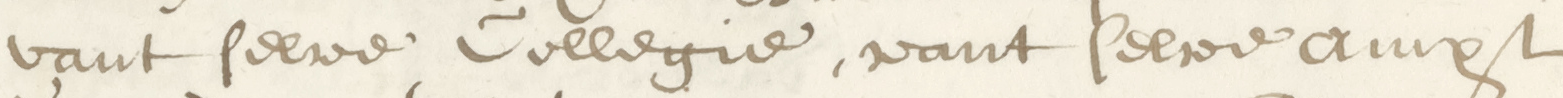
vant selve Collegie, vant selve ampt
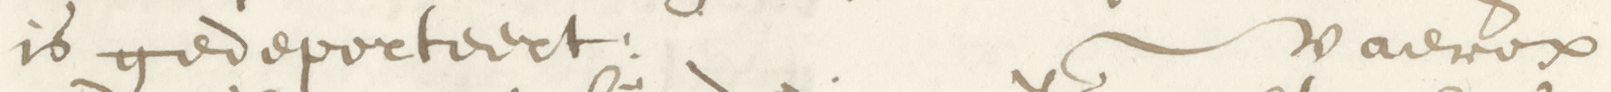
is gedeporteert: Waerop
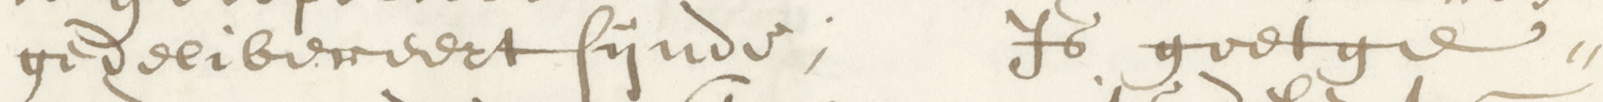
gedelibereert sijnde; Is goetge„
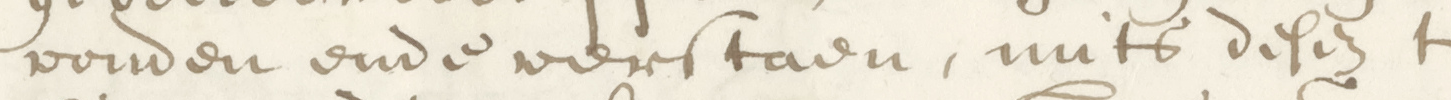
vonden ende verstaen, mits desen te
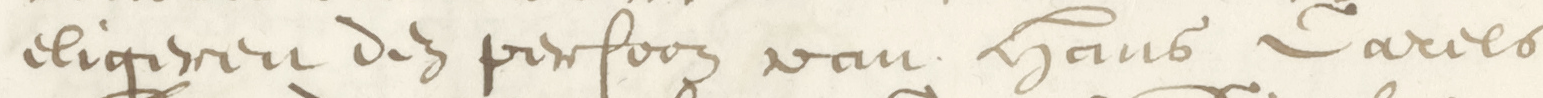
eligeren den persoon van Hans Carels
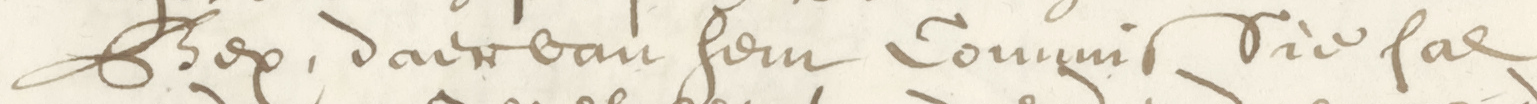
Bex, daervan hem Commissie sal
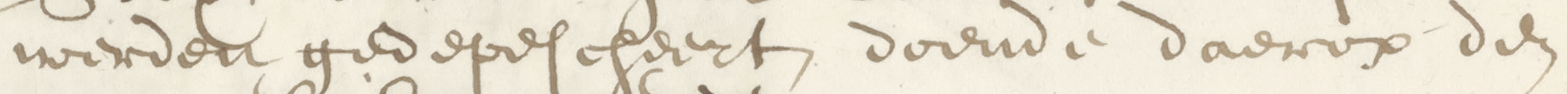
werden gedepescheert, doende daerop den
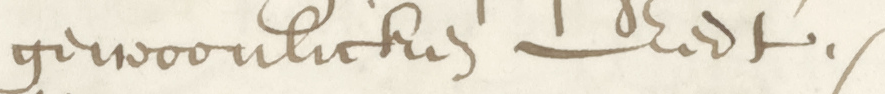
gewoonlicken Eedt.
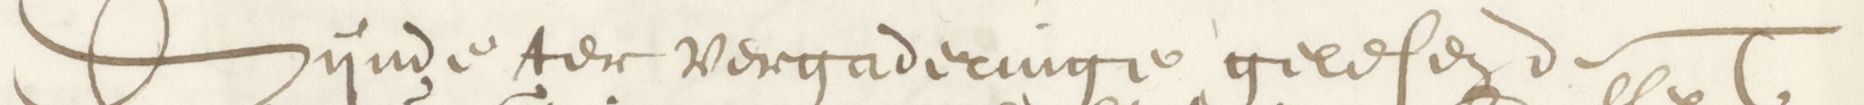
Sijnde ter Vergaderinge gelesen de
